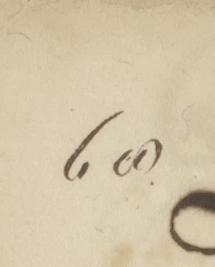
68.
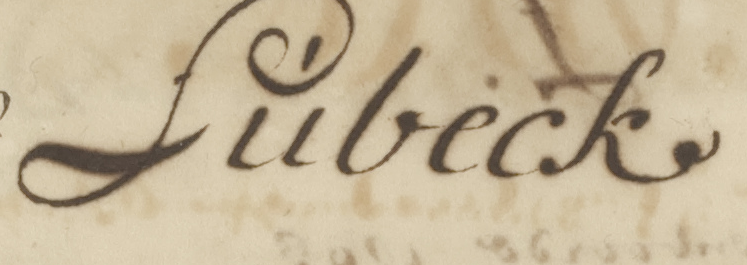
Lubeck
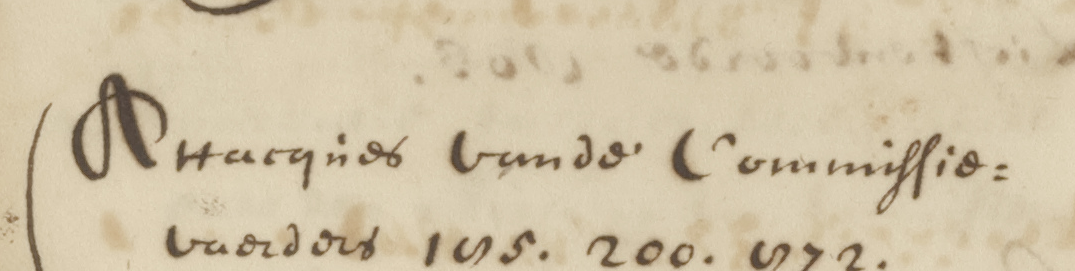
Attacques vande Commissie=
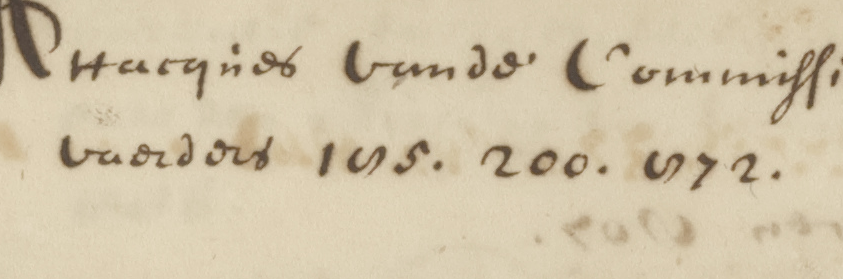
vaerders 185. 200. 872.
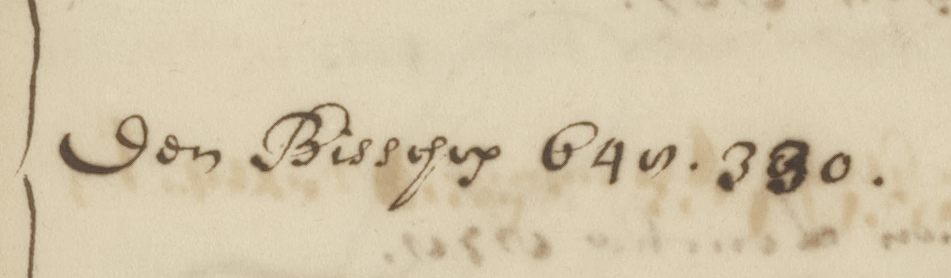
Den Bisschop 648. 330.
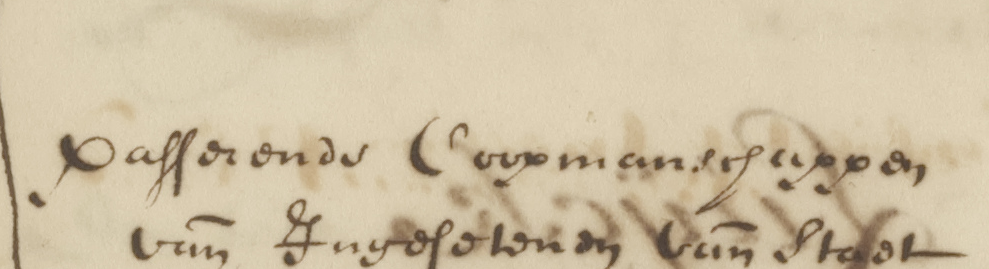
Passerende Coopmanschappen
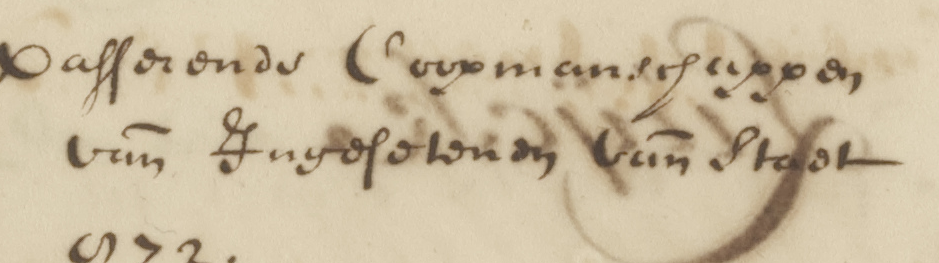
van Ingesetenen van Staet
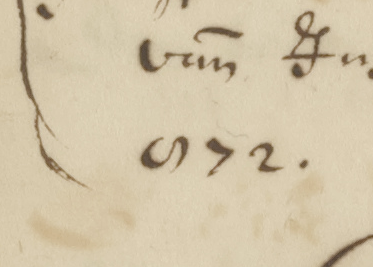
872.
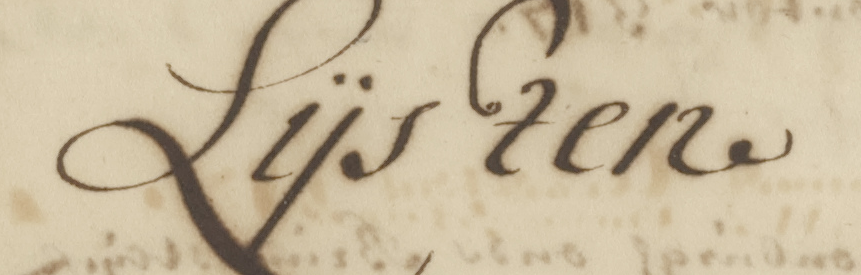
Lijsten
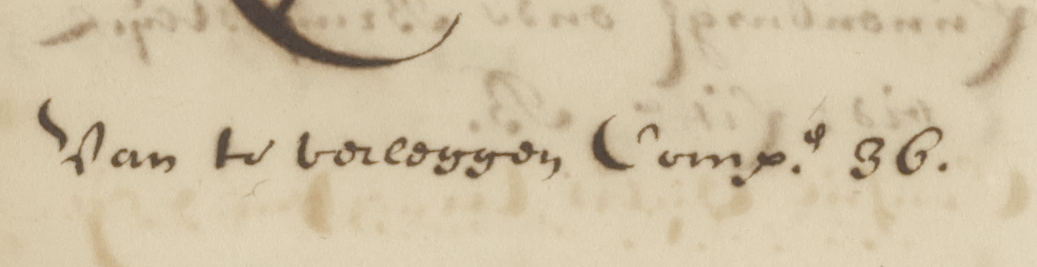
Van te verleggen Compe. 36.
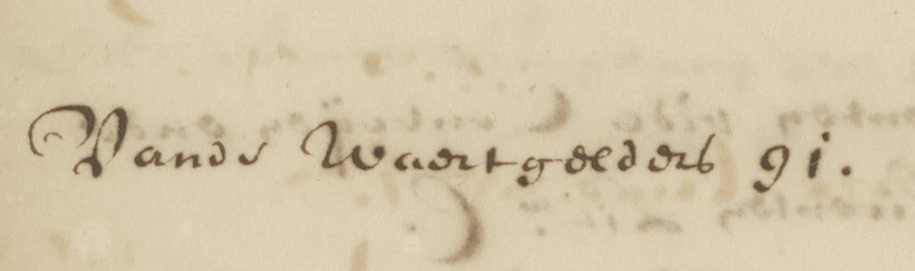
Vande Waertgelders 91.
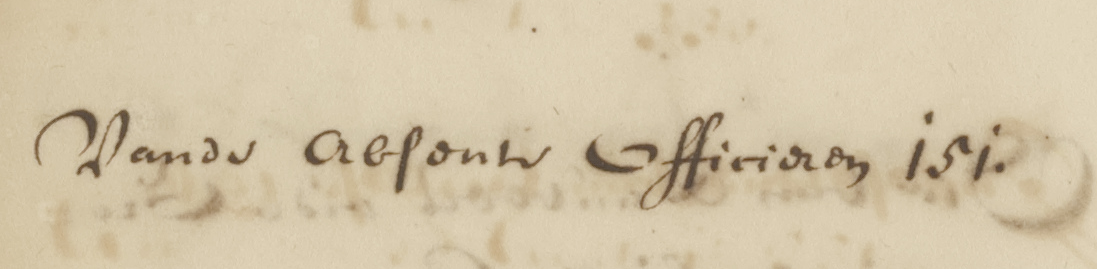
Vande Absente Officieren 151.
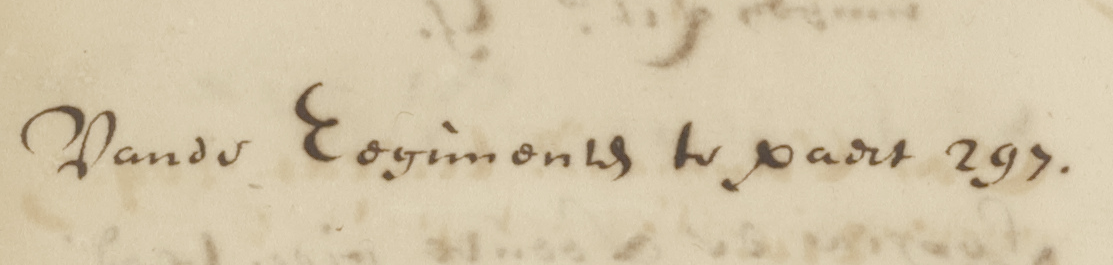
Vande Regimenten te paert 297.
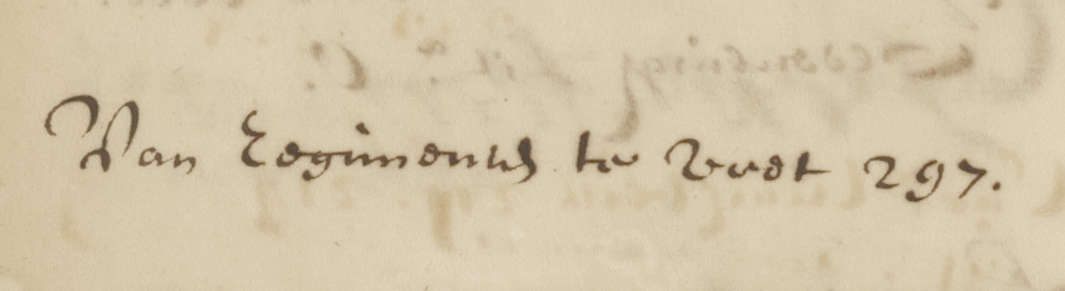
Van Regimenten te voet 297.
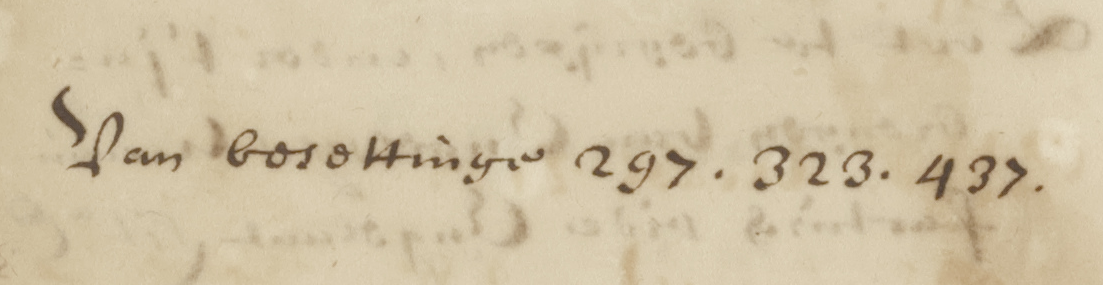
Van besettinge 297. 323. 437.
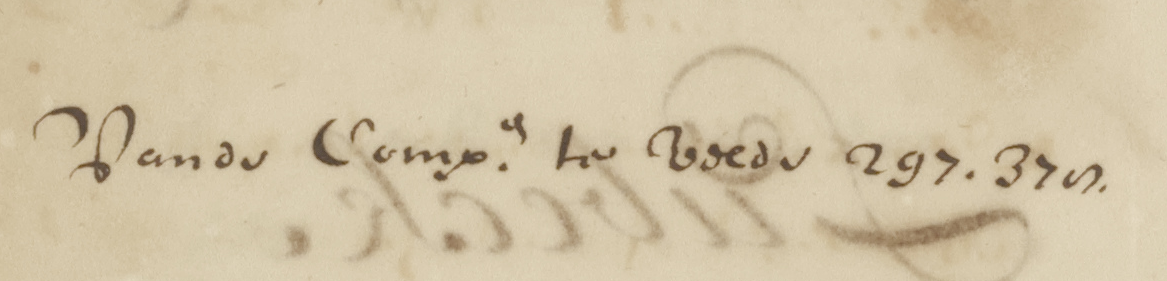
Vande Compe. te Velde 297. 378.
